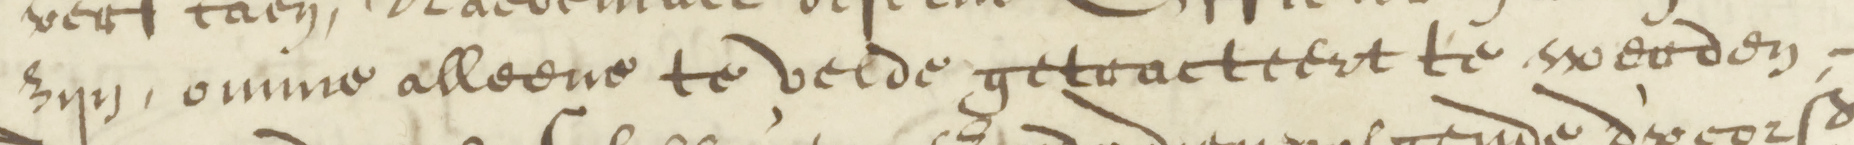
zyn, omme alleene te velde getracteert te werden, -
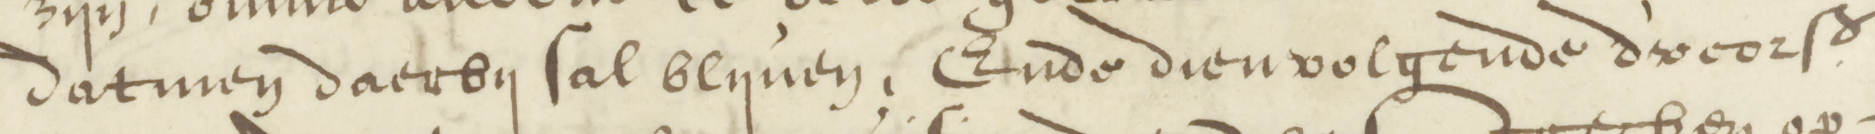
datmen daerby sal blyuen. Ende dienvolgende d'voors
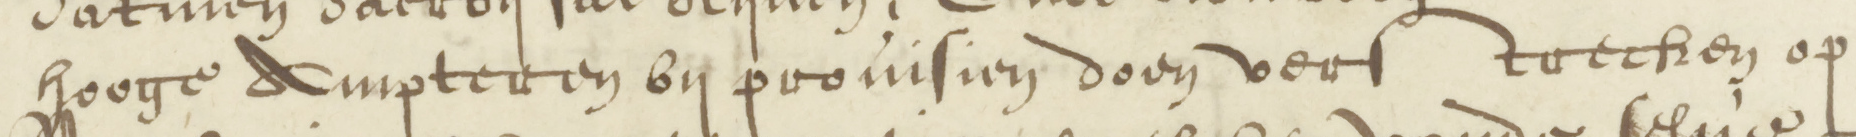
hooge Ampteren bij prouisien doen verstrecken op
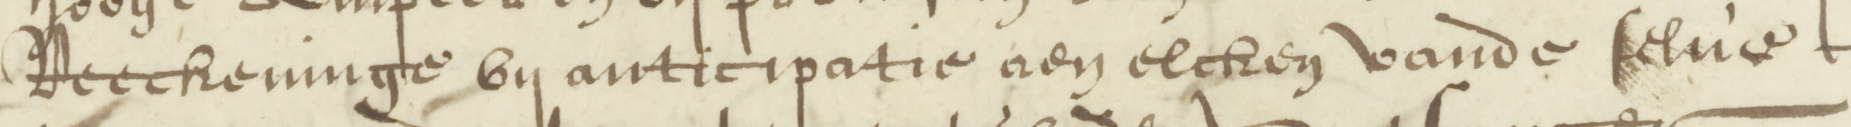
Reeckeninge by anticipatie aen elcken vande selue -
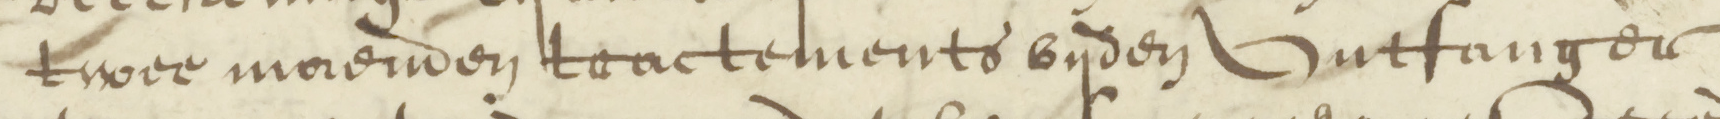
twee maenden tractements byden Ontfanger
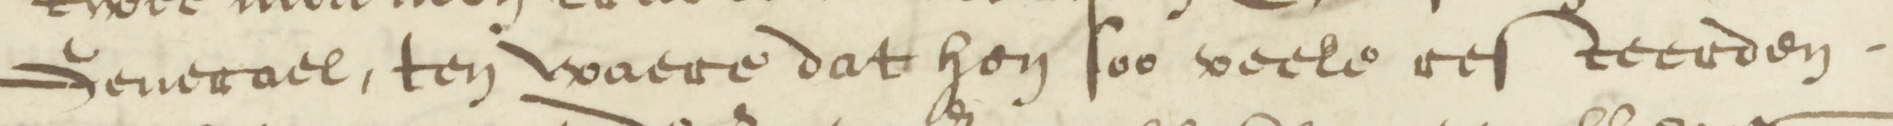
Generael, ten waere dat hen soo veele resteerden -
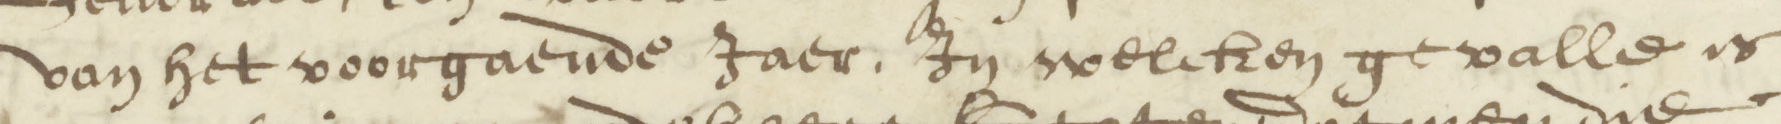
van het voorgaende Jaer, In welcken gevalle is
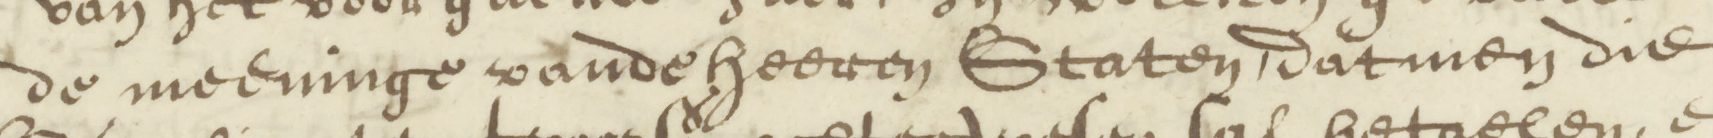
de meeninge vande heeren Staten, datmen die
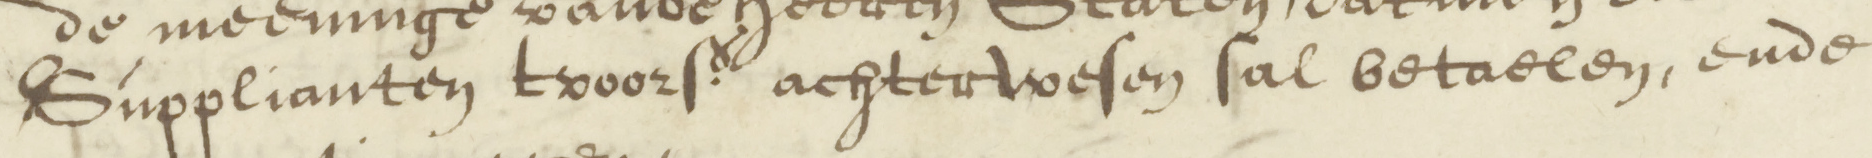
Supplianten tvoors. achterwesen sal betaelen, ende
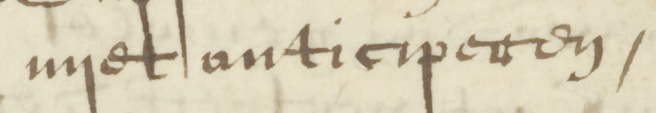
nyet anticiperen.
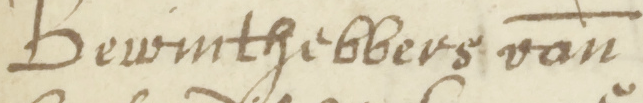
Bewinthebbers van
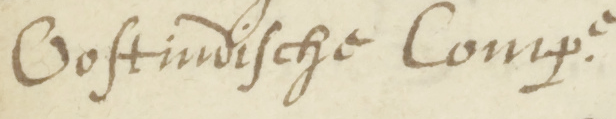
Oostindische Compe.
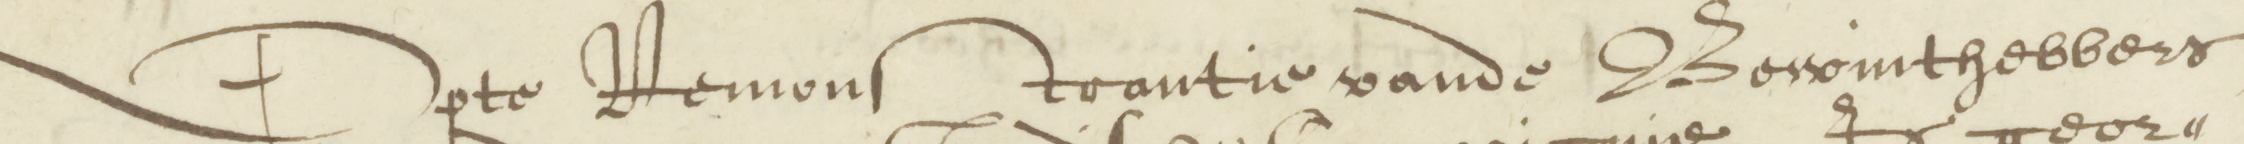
Opte Remonstrantie vande Bewinthebbers
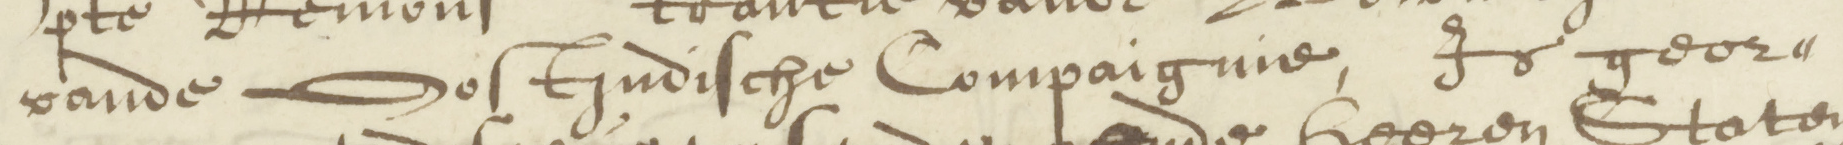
vande Oostindische Compaignie, Is geor„
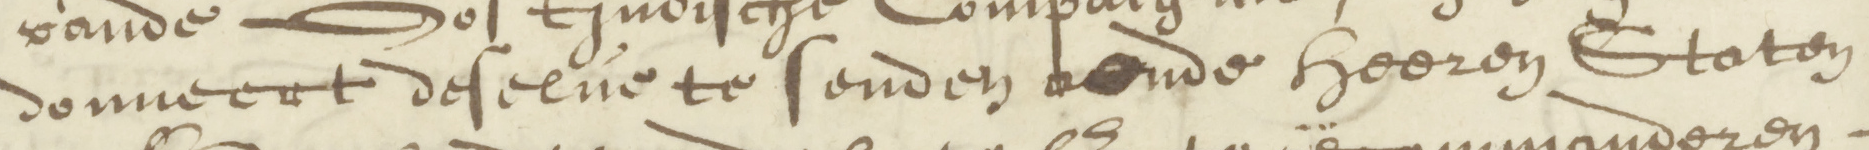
donneert deselue te senden aende Heeren Staten
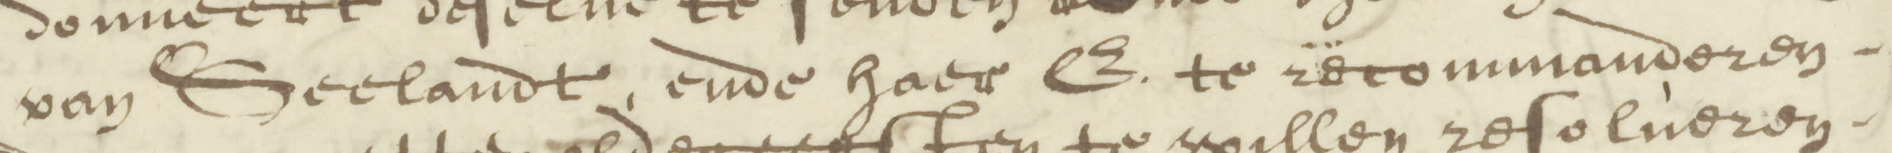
van Seelandt ende haer E. te recommanderen -
